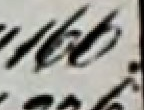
166
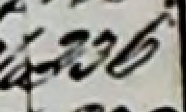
236
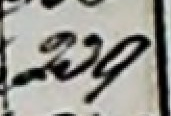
239
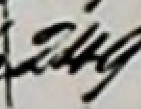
249
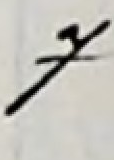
7
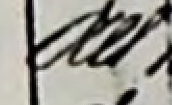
Alt
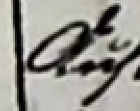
Aus
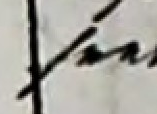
see
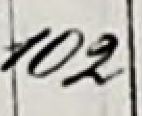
102
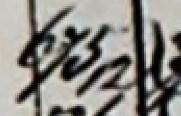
675,2
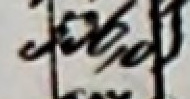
536,0
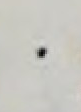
„
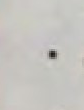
„
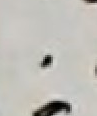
„
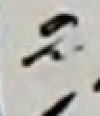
2
